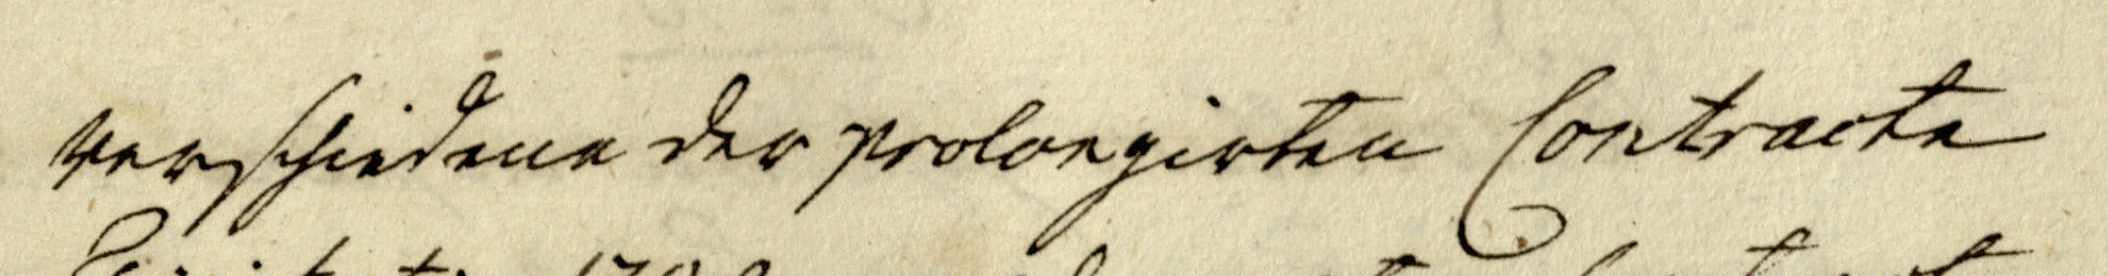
verschiedene der prolongirten Contracte
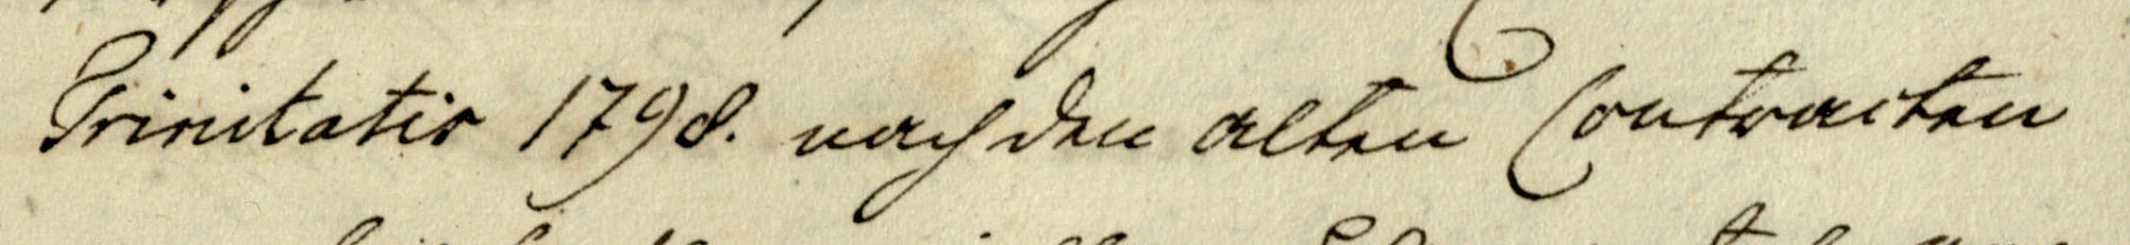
Trinitatis 1798. nach den alten Contracten
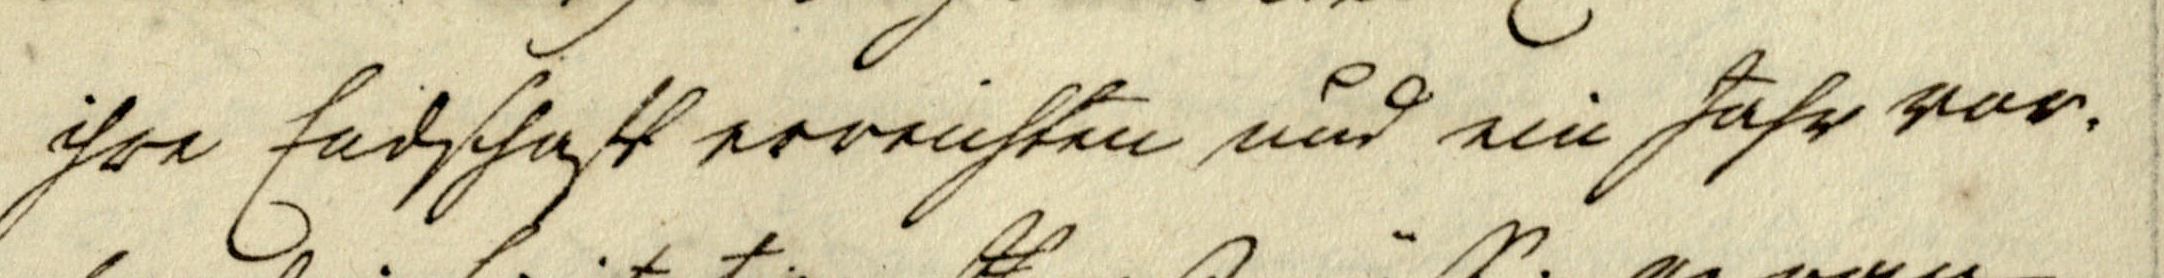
ihre Endschaft erreichten und ein Jahr vor¬
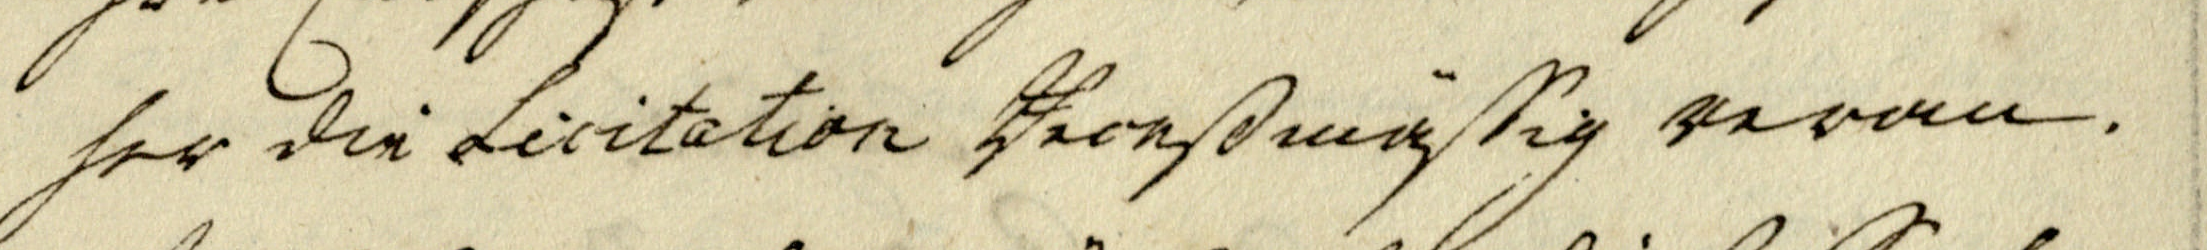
her die Licitation Recesmässig veran¬
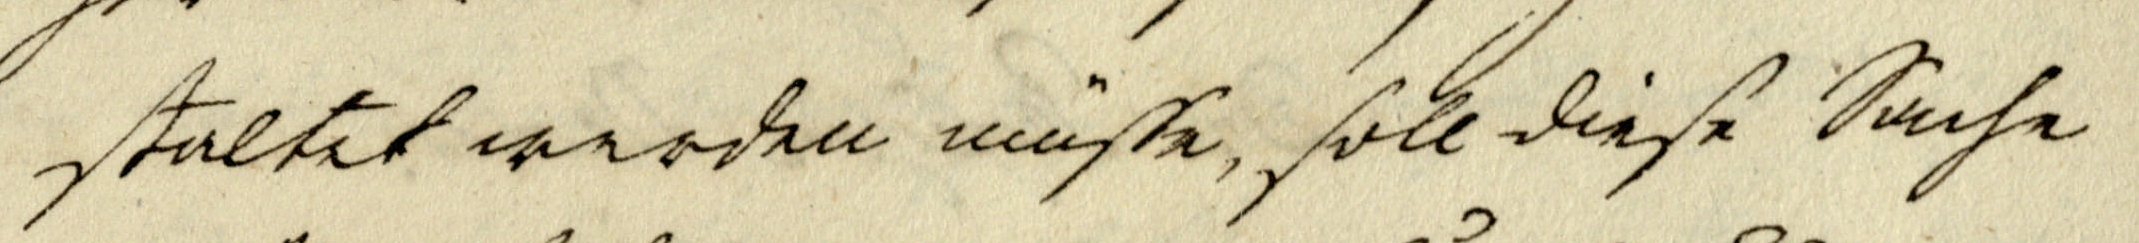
staltet werden müsse, soll diese Sache
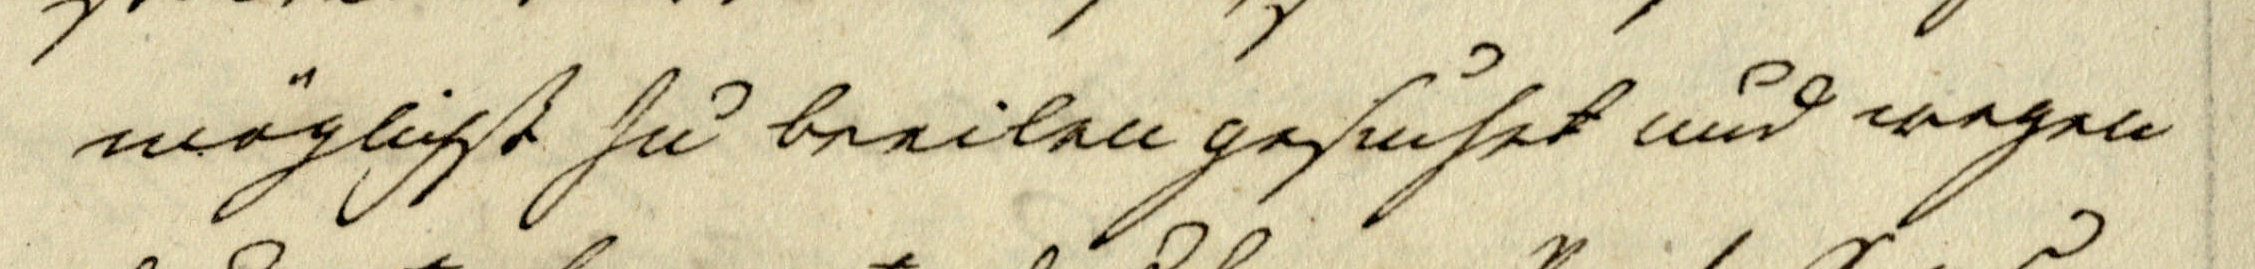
möglichst zu beeilen gesuchet und wegen
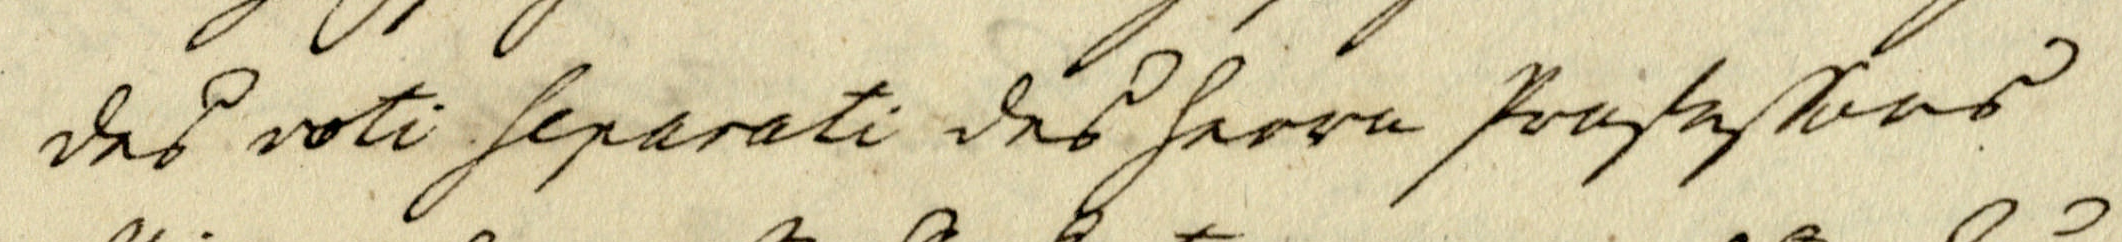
des voti separati des Herrn Professors
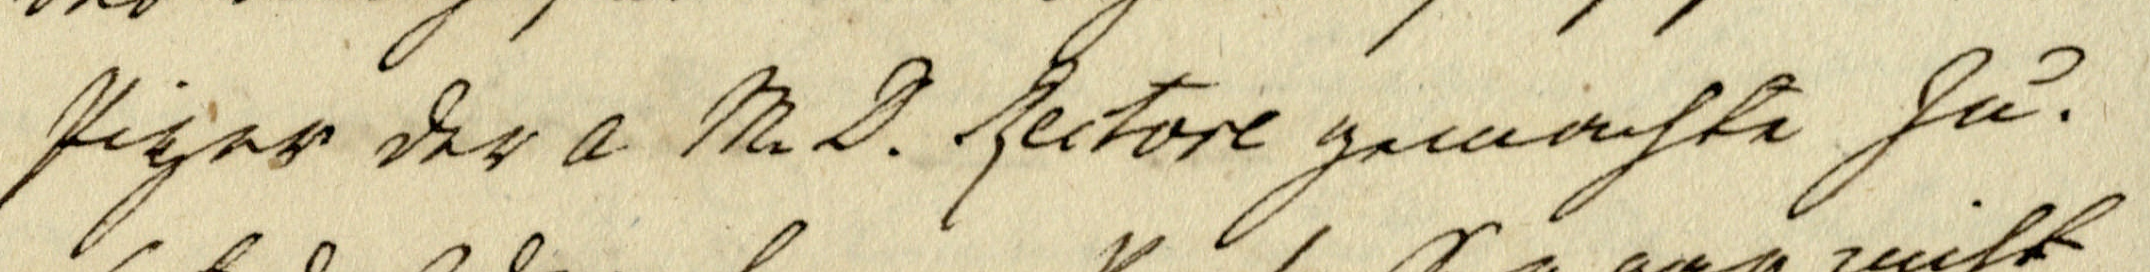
Piper der a M. D. Rectore gemachte Zu¬
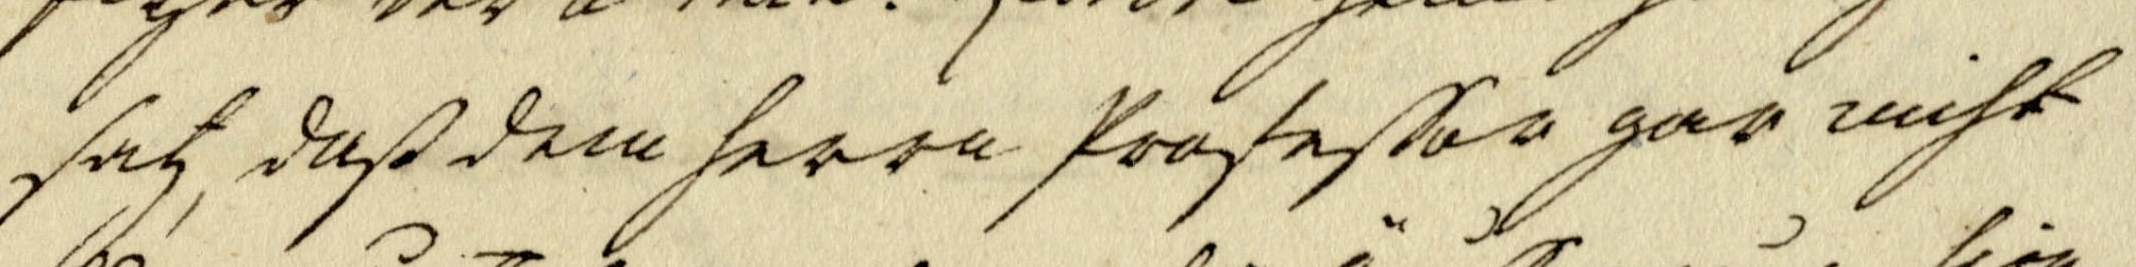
satz, daß dem Herrn Professor gar nicht
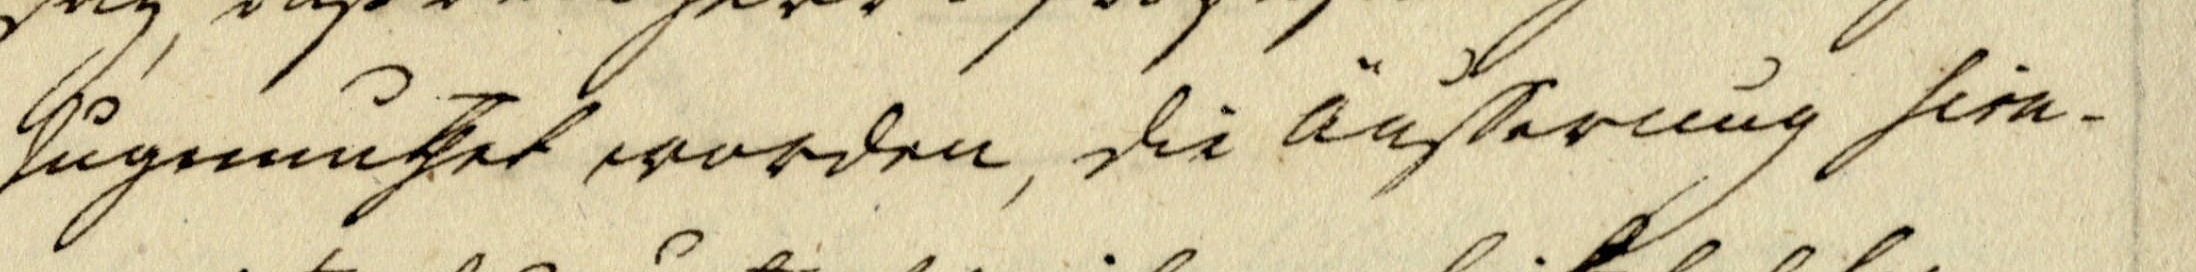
zugemuthet worden, die Äusserung sim¬
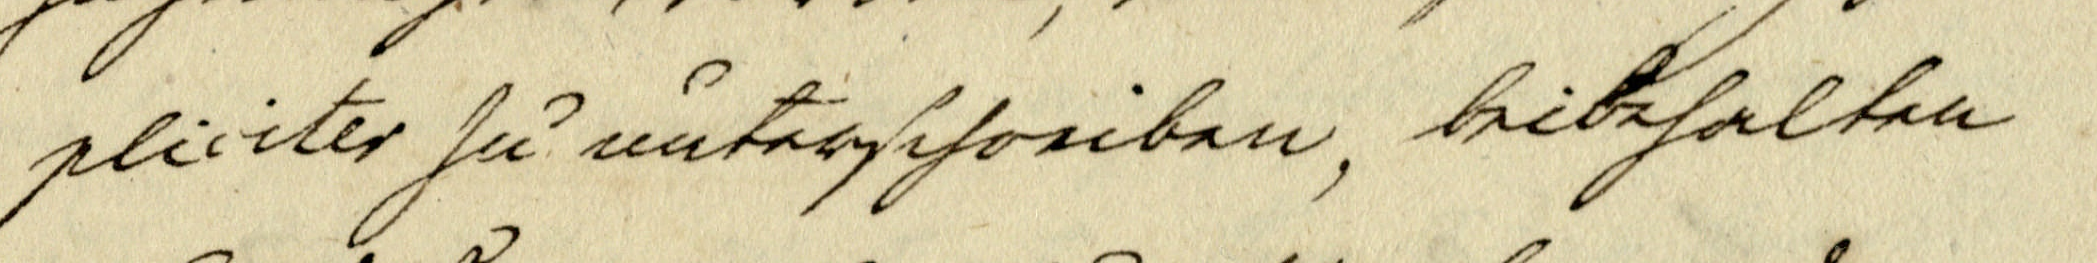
pliciter zu unterschreiben, beibehalten
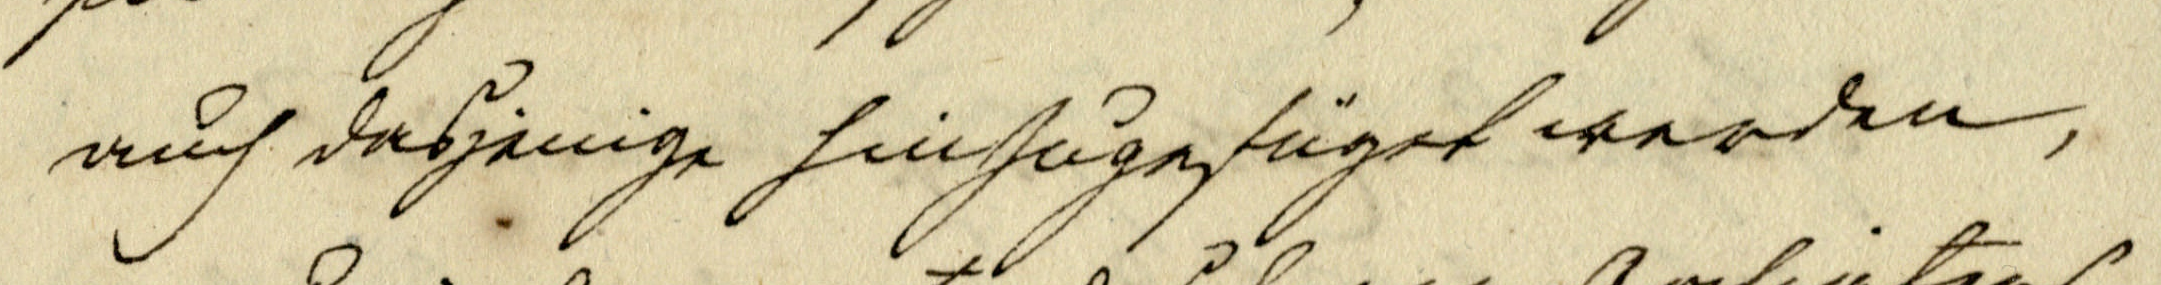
auch dasjenige hinzugefüget werden,
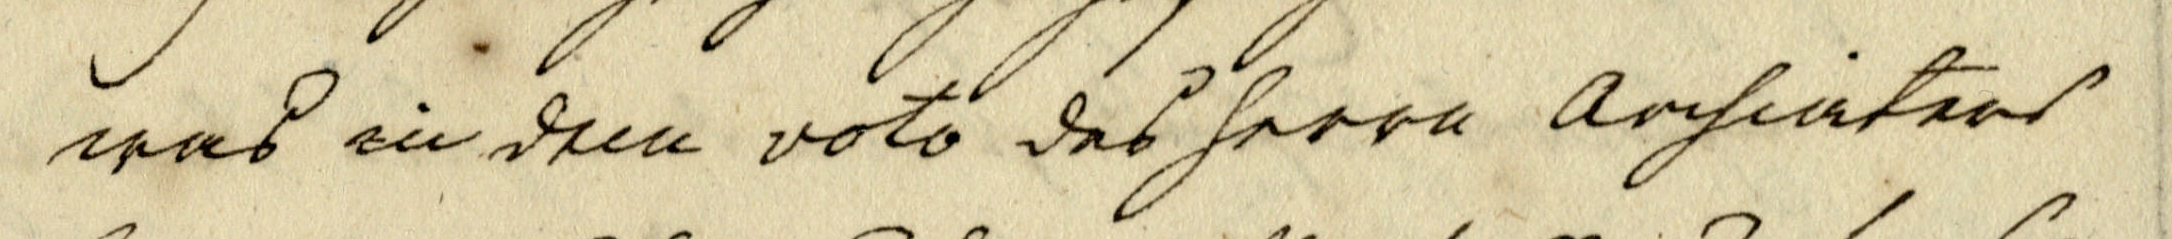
was in dem voto des Herrn Archiaters
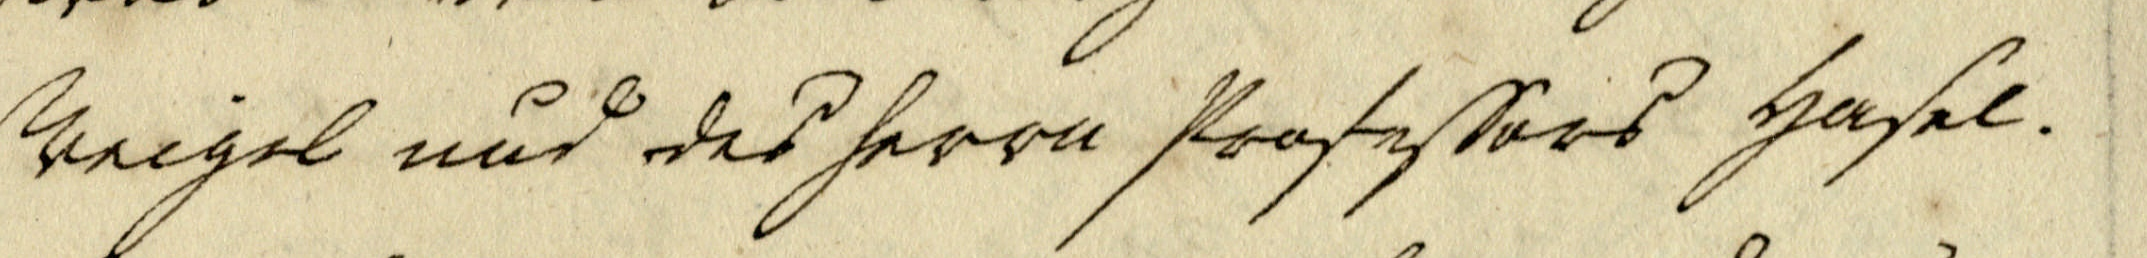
Weigel und des Herrn Professors Hasel¬
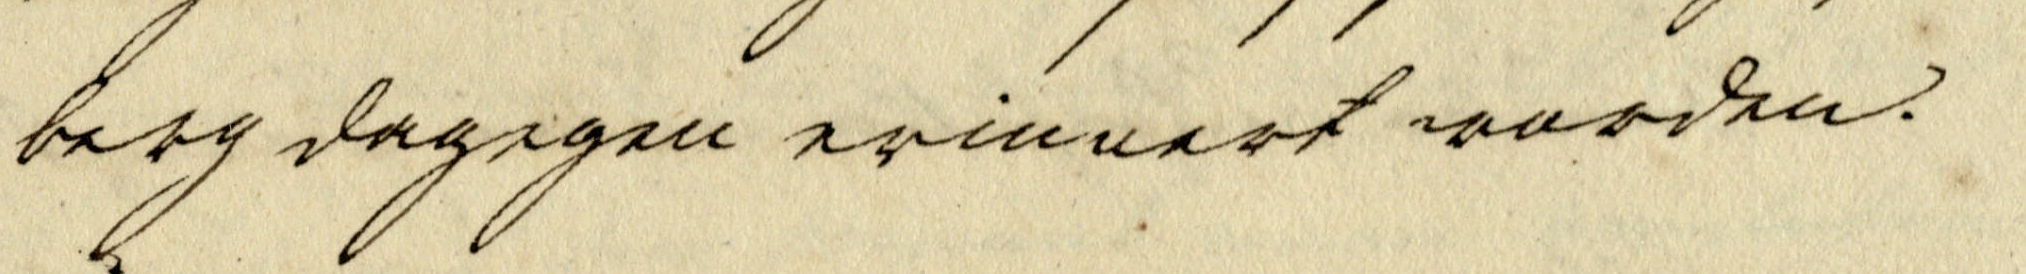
berg dagegen erinnert worden.
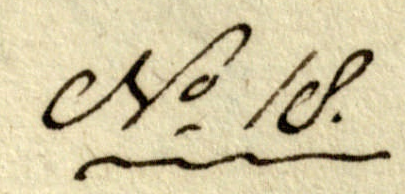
No 18.
